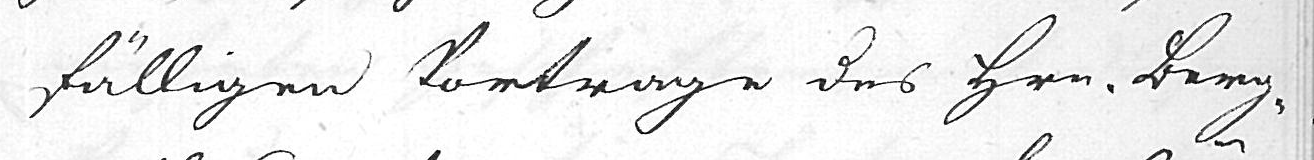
fälligen Vorträge des Hrn. Berg-
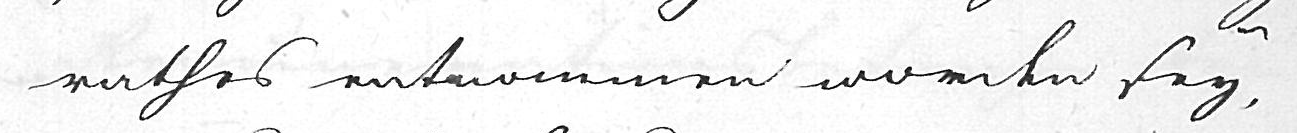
rathes entnommen worden sey,
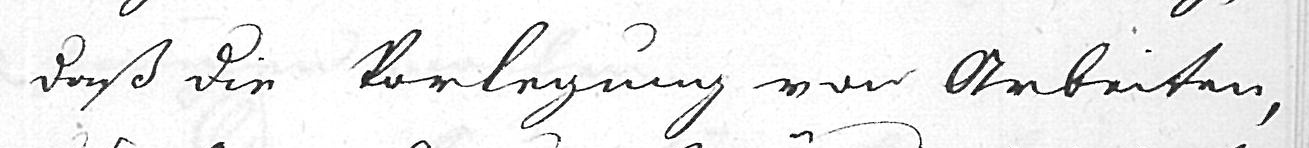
daß die Vorlegung von Arbeiten,
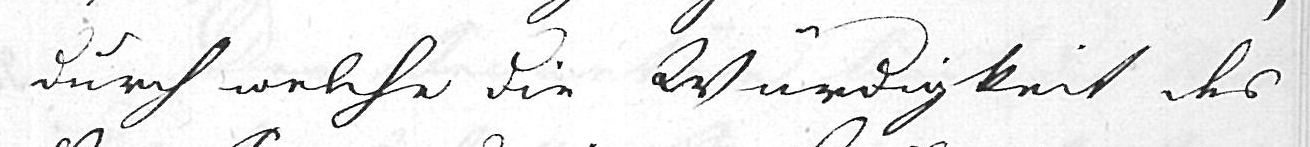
durch welche die Würdigkeit des
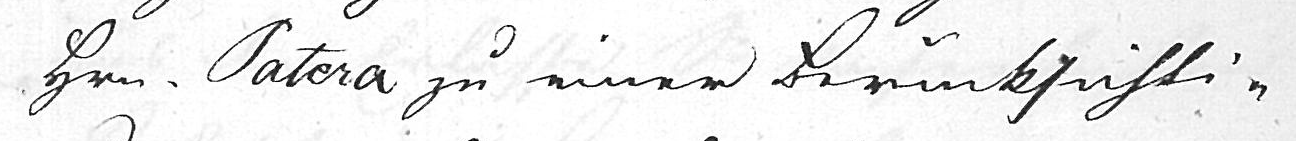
Hrn. Patera zu einer Berücksichti-
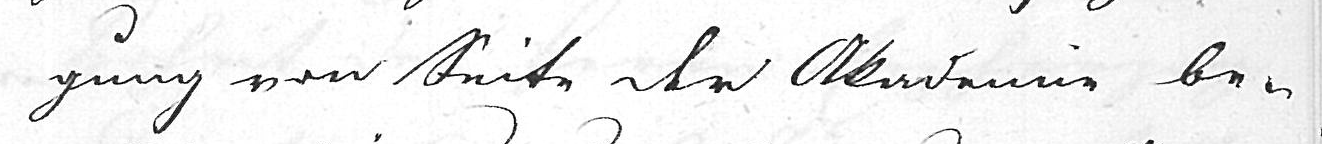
gung von Seite der Akademie be-
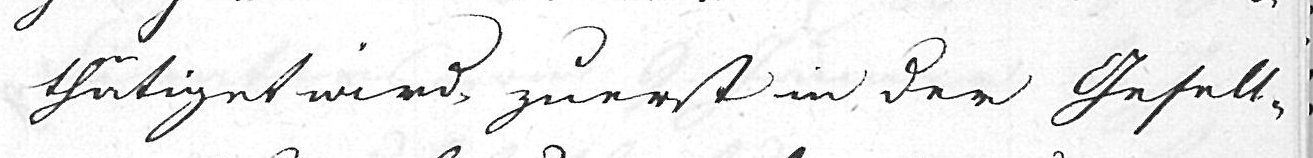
thätiget wird, zuerst in der Gesell-
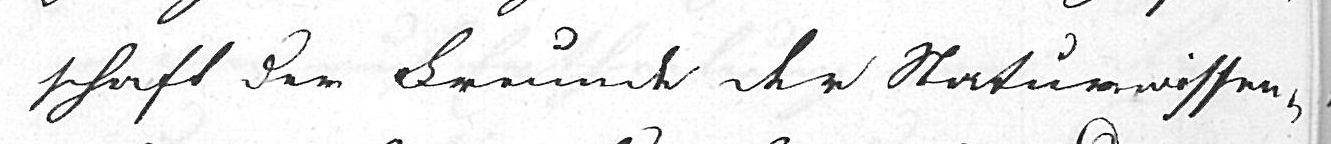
schaft der Freunde der Naturwissen-
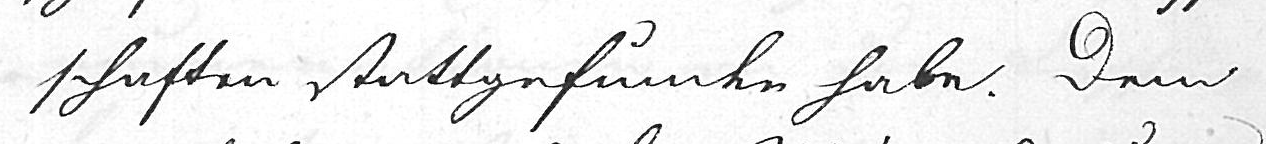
schaften stattgefunden habe. Dem
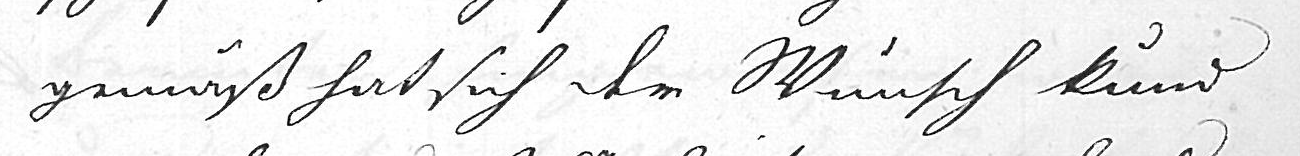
gemäß hat sich der Wunsch kund
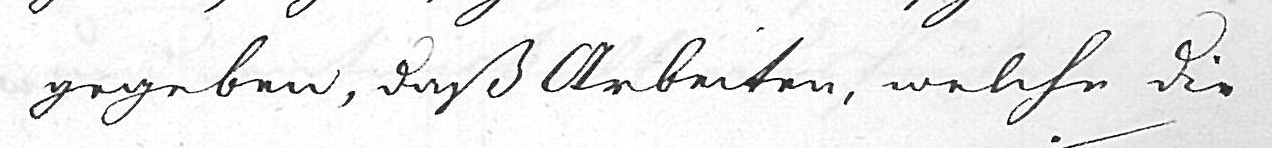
gegeben, daß Arbeiten, welche die
